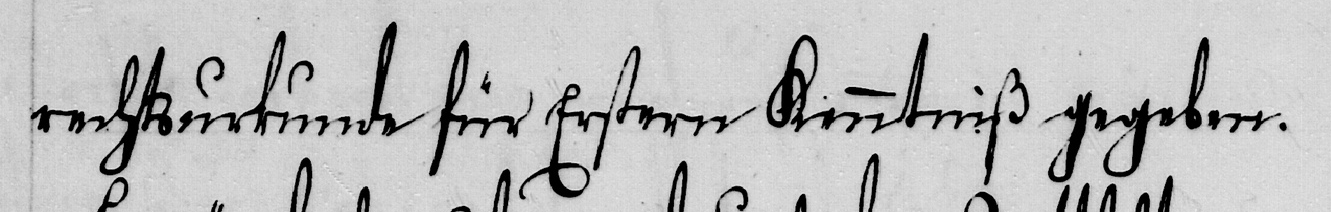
rechtsurkunde für Erstern Kenntniß gegeben.
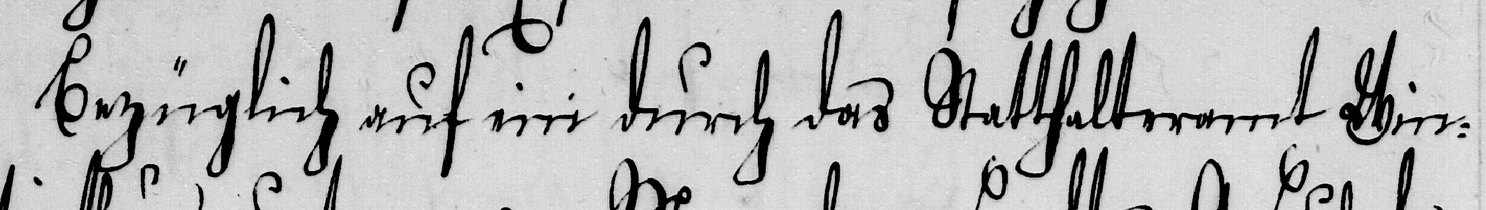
Bezüglich auf ein durch das Statthalteramt Win¬
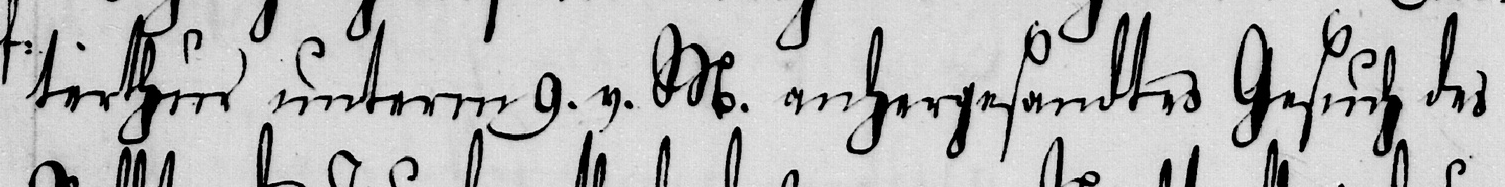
terthur unterm 9. v. M. anhergesandtes Gesuch des
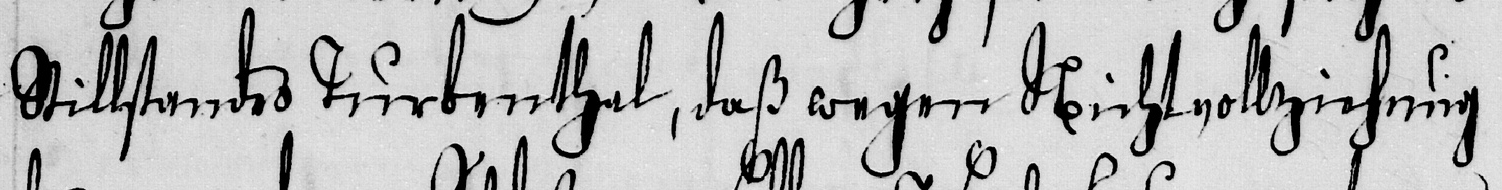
tillstandes Turbenthal, daß wegen Nichtvollziehung
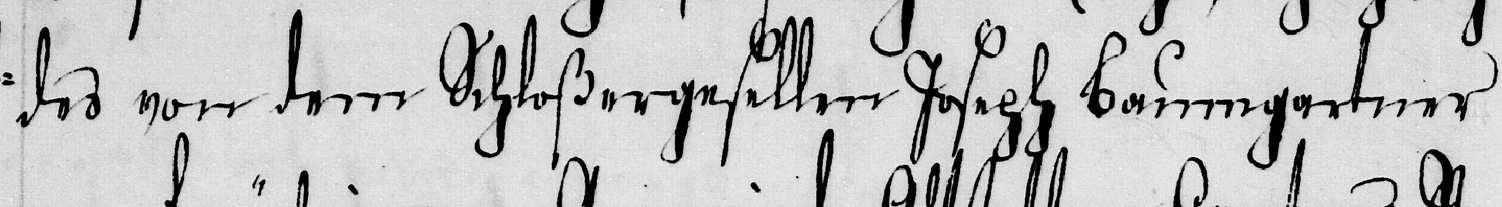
des von dem Schloßergesellen Joseph Baumgartner
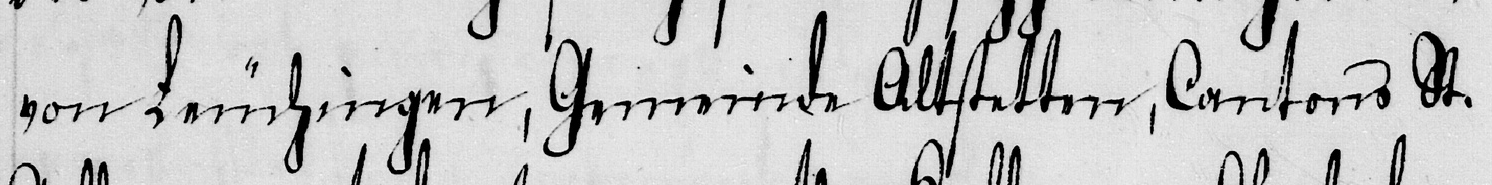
von Leuschingen, Gemeinde Altstetten, Cantons St.
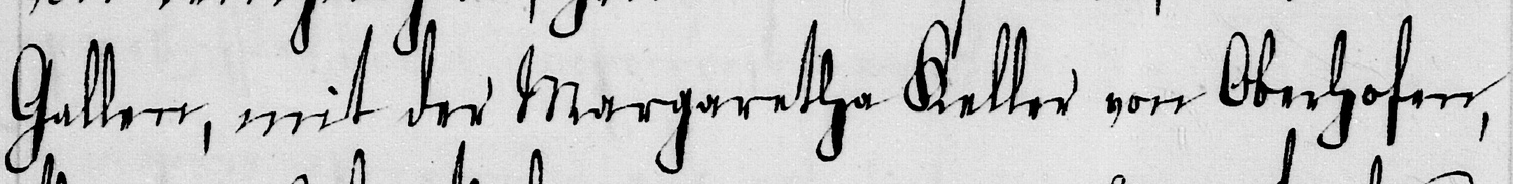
Gallen, mit der Margaretha Keller von Oberhofen,
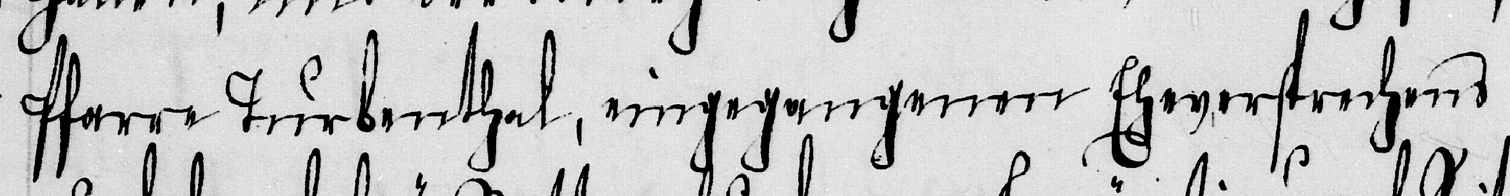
Pfarre Turbenthal, eingegangenen Eheversprechens
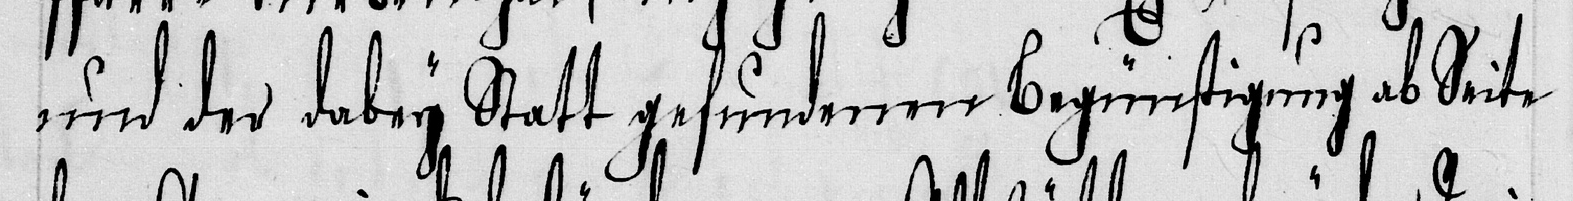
und der dabey Statt gefundenen Begünstigung ab Seite
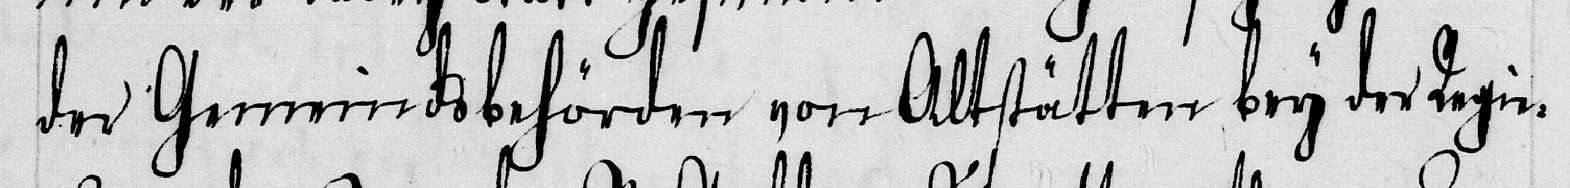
der Gemeindsbehörden von Altstätten bey der Regie¬
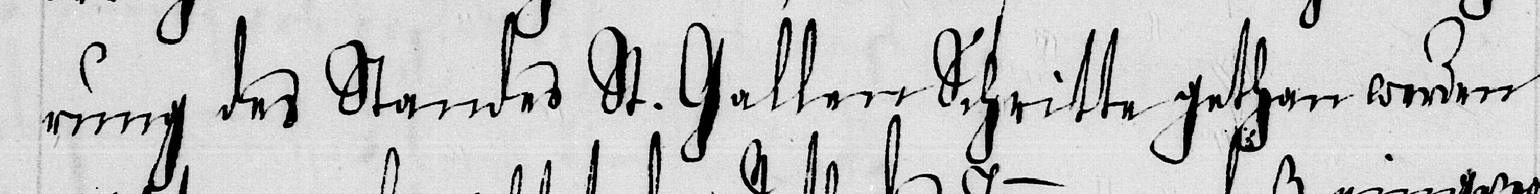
rung des Standes St. Gallen Schritte gethan werden
